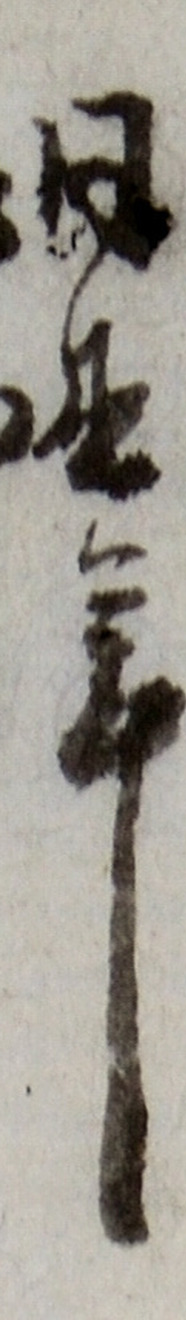同丑年
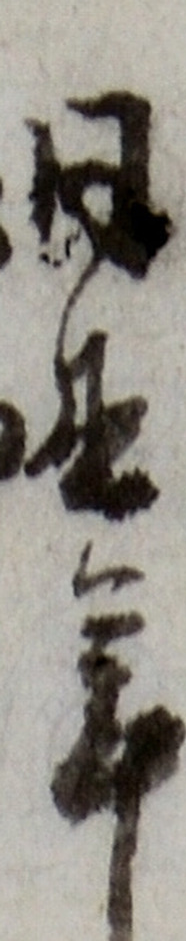同丑年
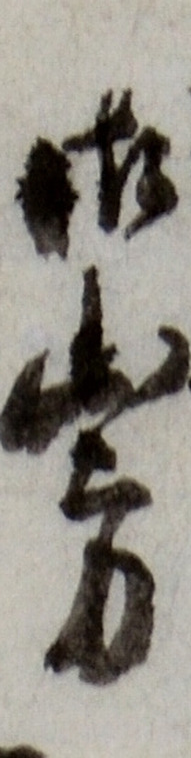御山方
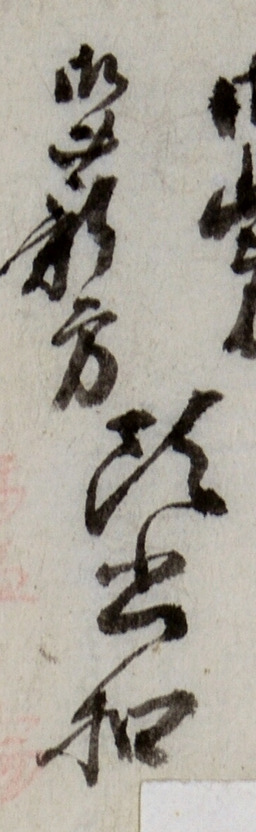御薪方頭書扣
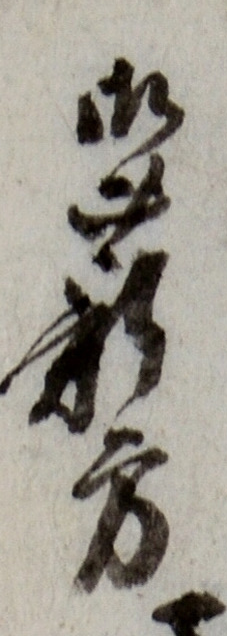御山方
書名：御山方御薪方頭書控
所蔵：伊那市立高遠町図書館・合同会社AMANE
